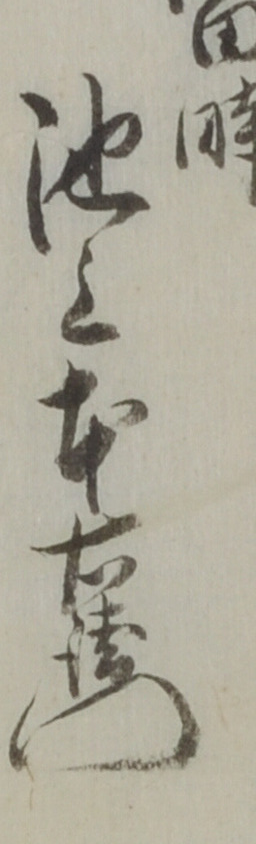池上本右衛門
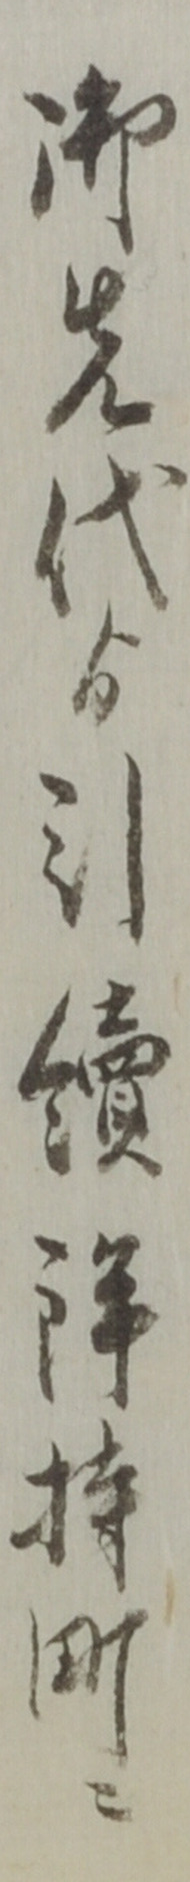御先代ゟ引続鉾持町ニ
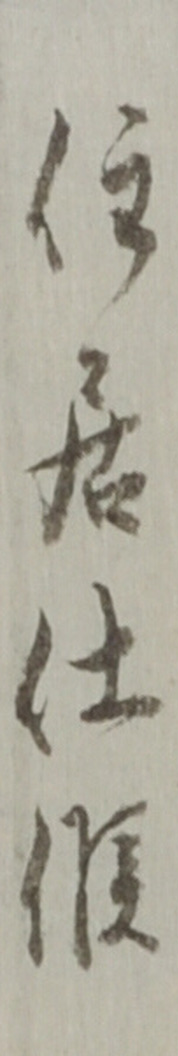住居仕候
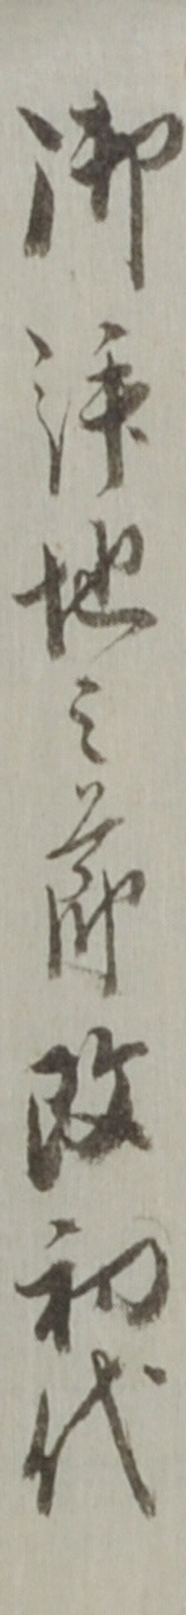御拝地之節改初代
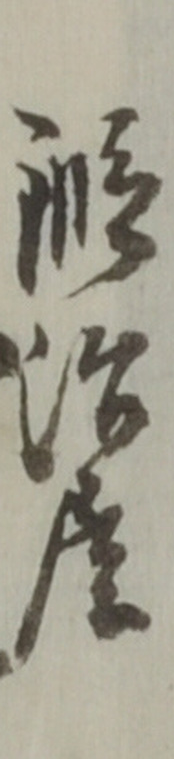鍛冶屋
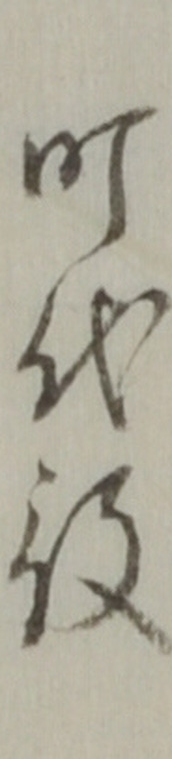町代役
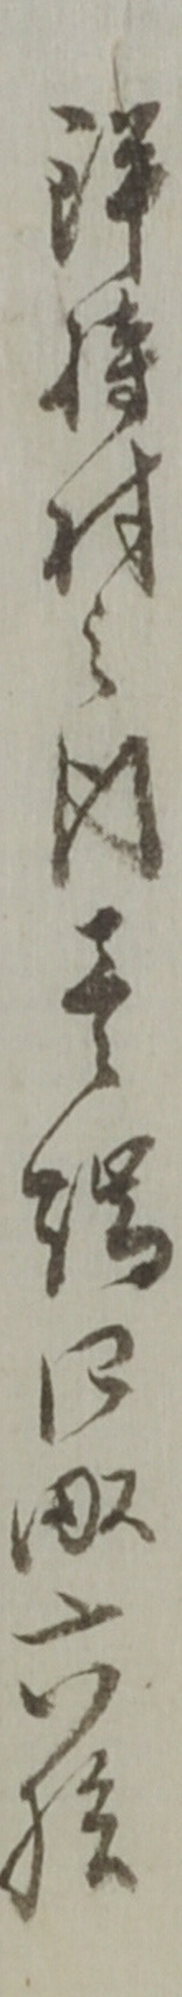鉾持村之内壱端四畝六拾
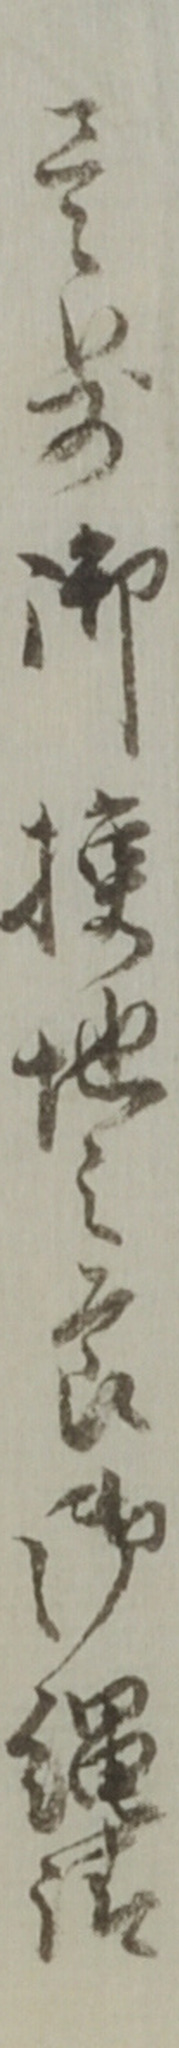壱歩御検地之節御縄請
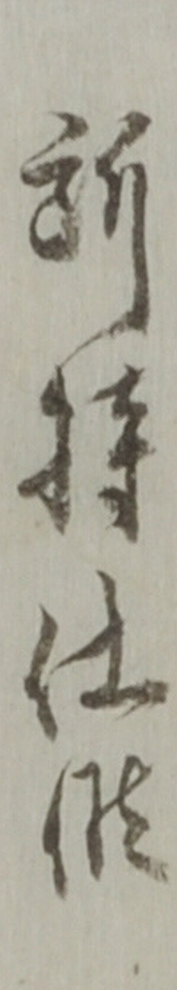所持仕候
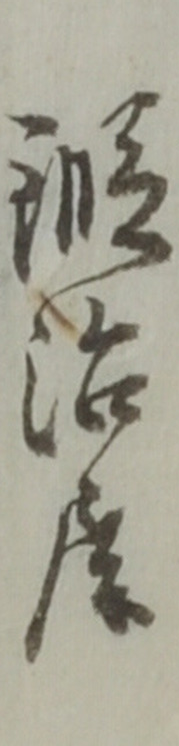鍛冶屋
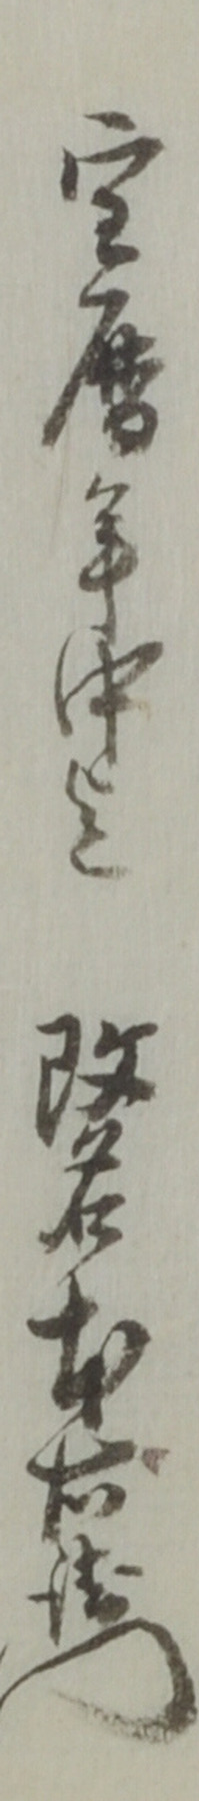宝暦年中迄改名本右衛門
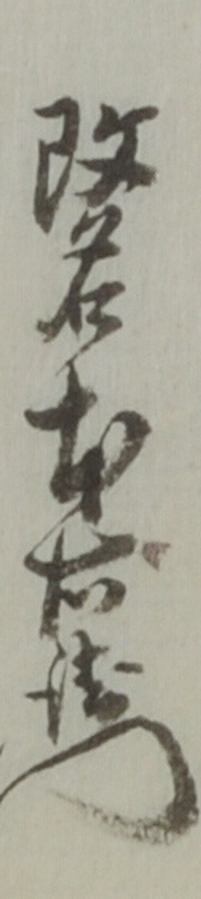池上本右衛門
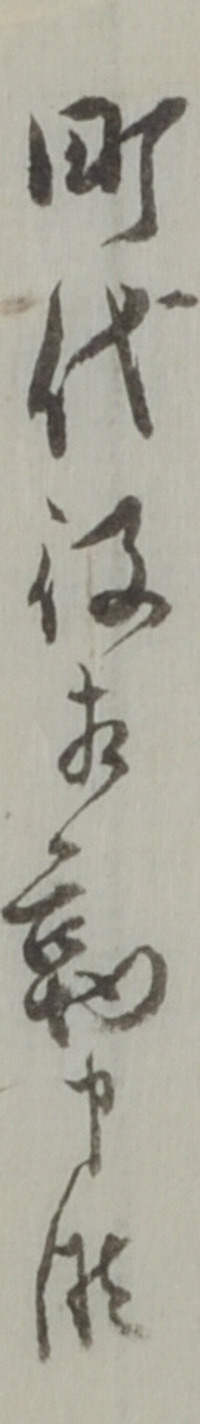町代役相勤申候

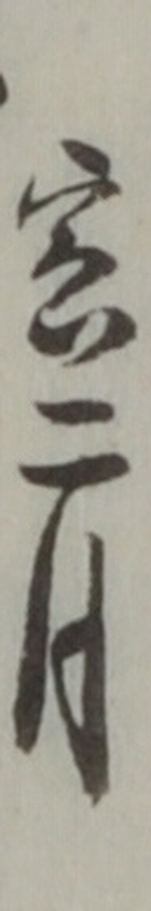寅二月
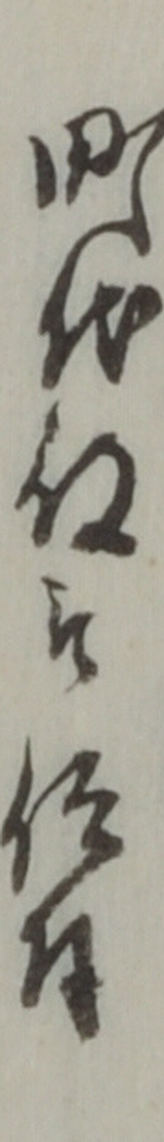町代役被仰付
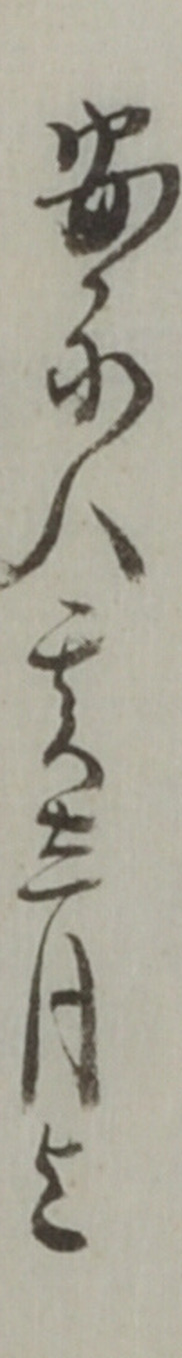安永八亥十二月迄
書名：（書上）
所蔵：伊那市立高遠町図書館・合同会社AMANE
